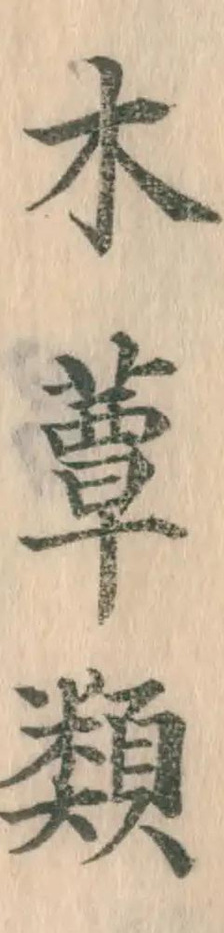木蕈類
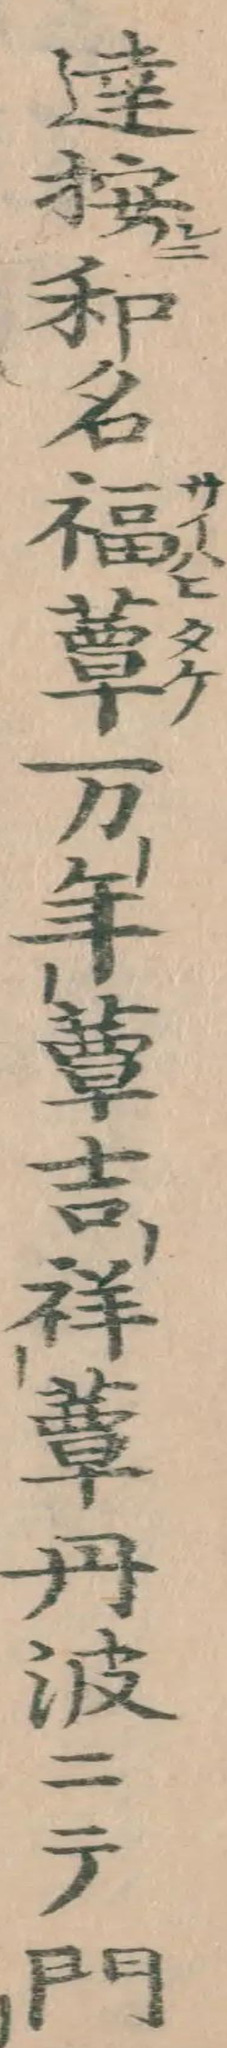達按和名福蕈万年蕈吉祥蕈丹波ニテ門
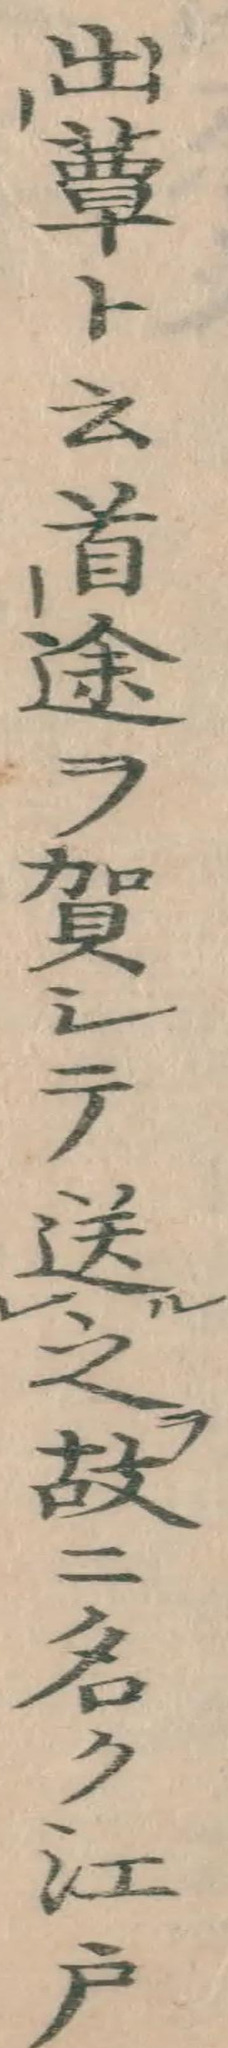出蕈ト云首途ヲ賀シテ送之故ニ名ク江戸
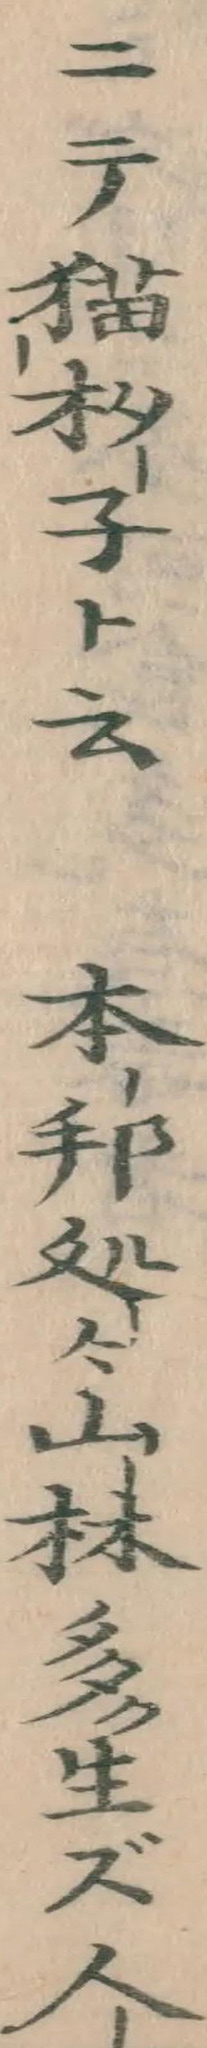ニテ猫杓子ト云本邦処々山林多生ズ人
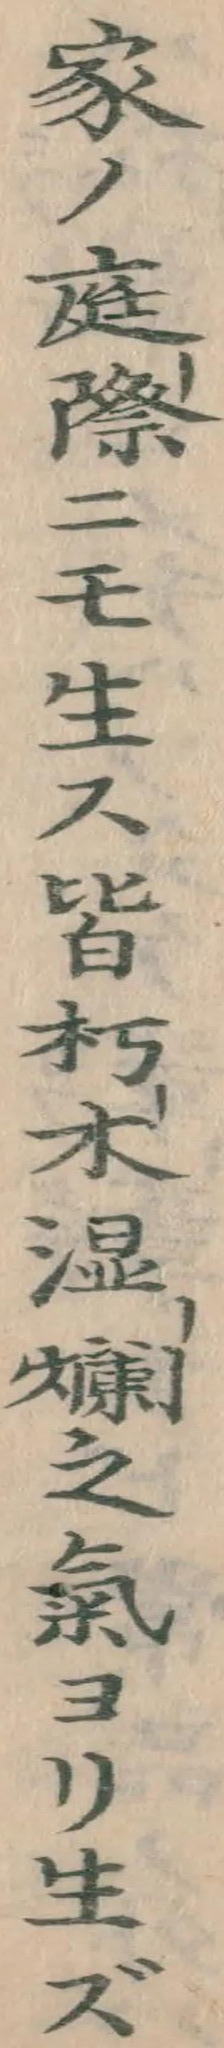家ノ庭際ニモ生ス皆朽木湿爛之気ヨリ生ズ
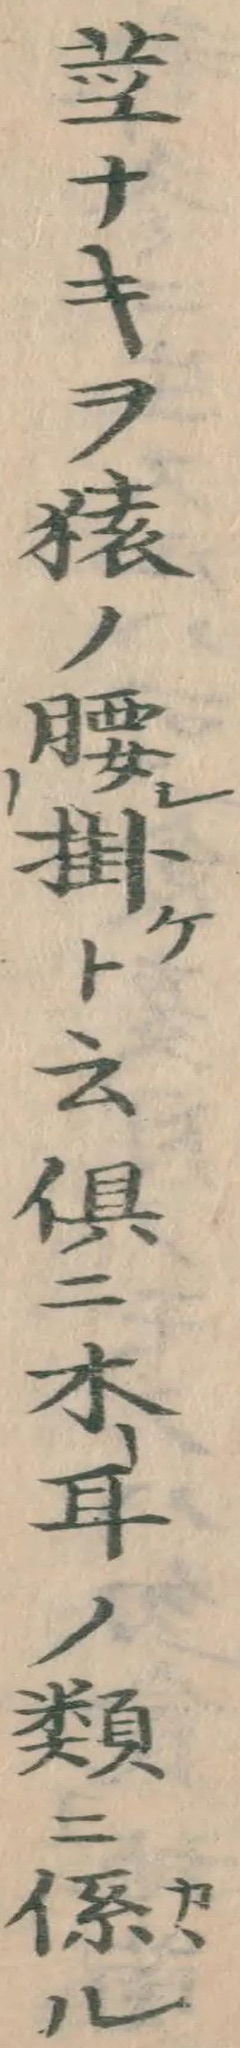茎ナキヲ猿ノ腰掛ト云俱ニ木耳ノ類ニ係ル
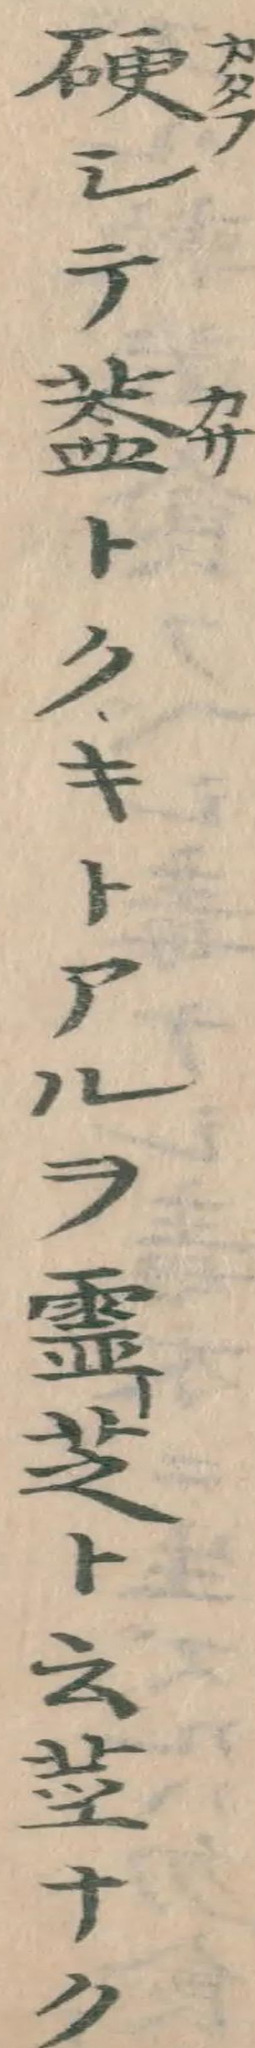硬シテ葢トクキトアルヲ霊芝ト云茎ナク
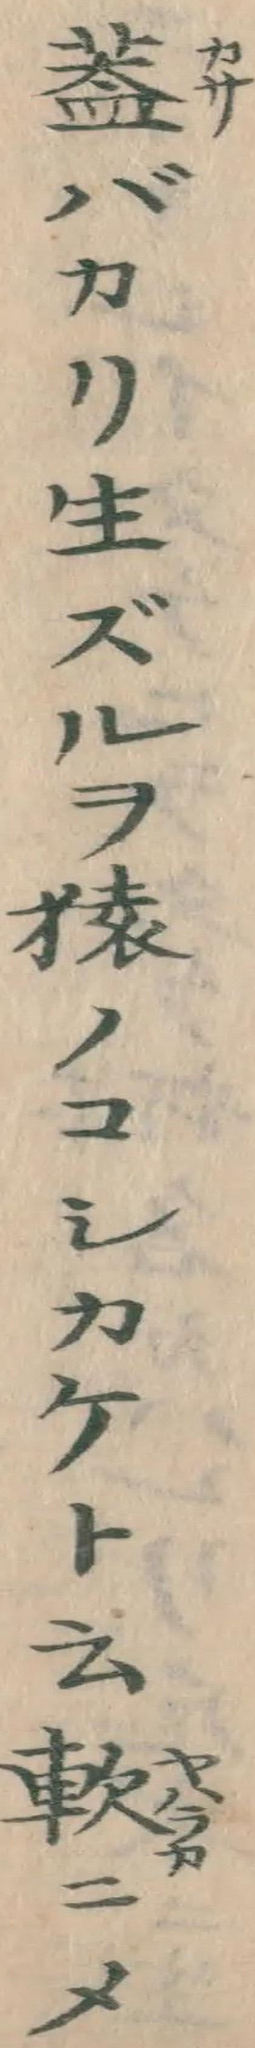葢バカリ生ズルヲ猿ノコシカケト云軟ニシテ
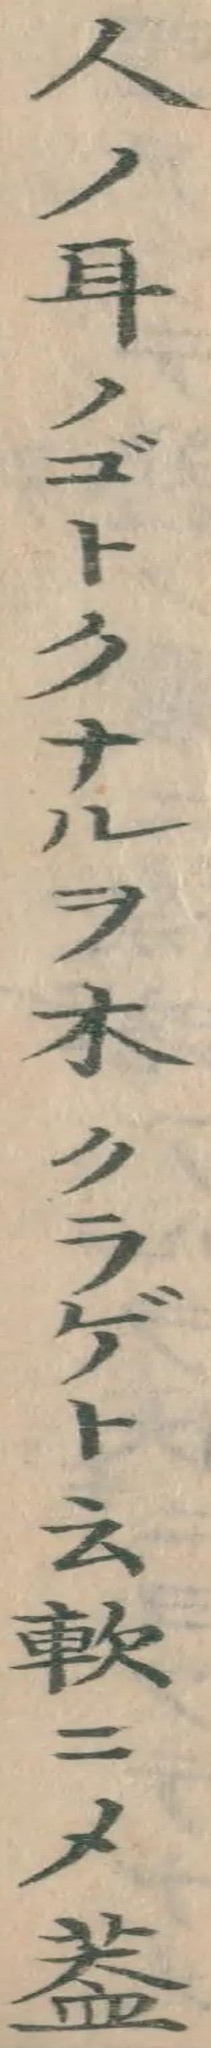人ノ耳ノゴトクナルヲ木クラゲト云軟ニシテ葢

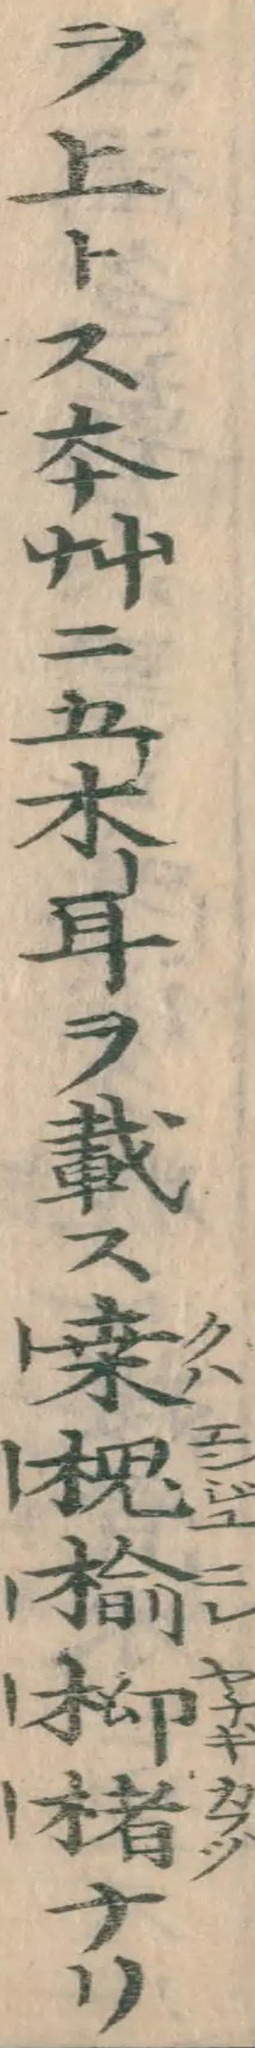ヲ上トス本草ニ五木耳ヲ戴ス桑槐楡柳楮ナリ
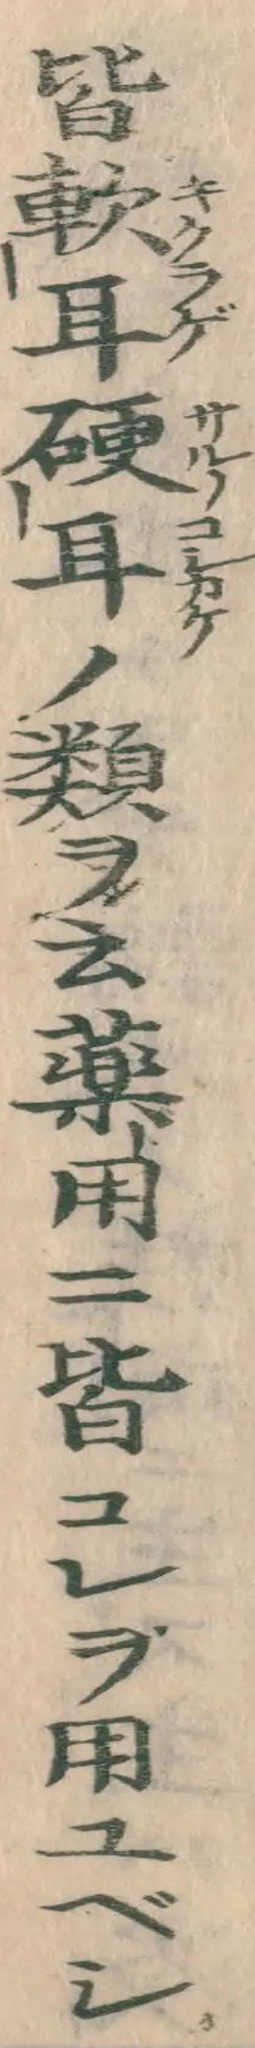皆軟耳硬耳ノ類ヲ云薬用ニ皆コレヲ用ユベシ
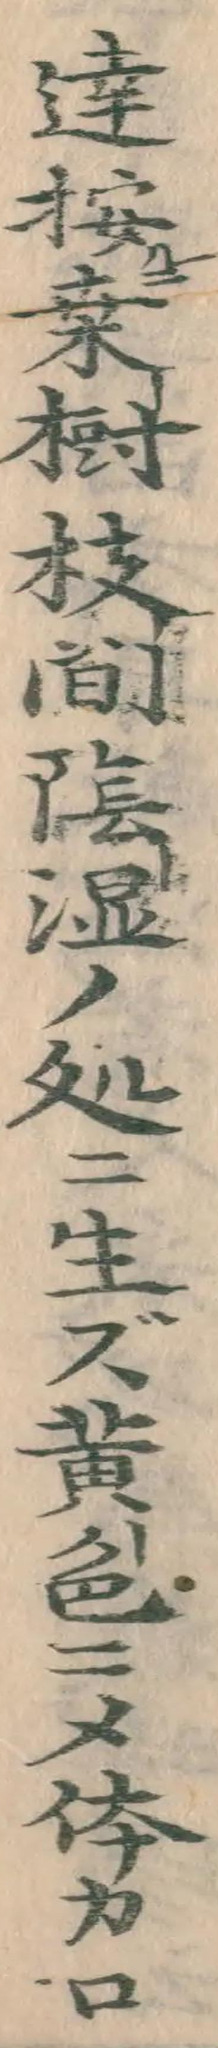達按桑樹枝間陰湿ノ処ニ生ズ黄色ニシテ体カロ
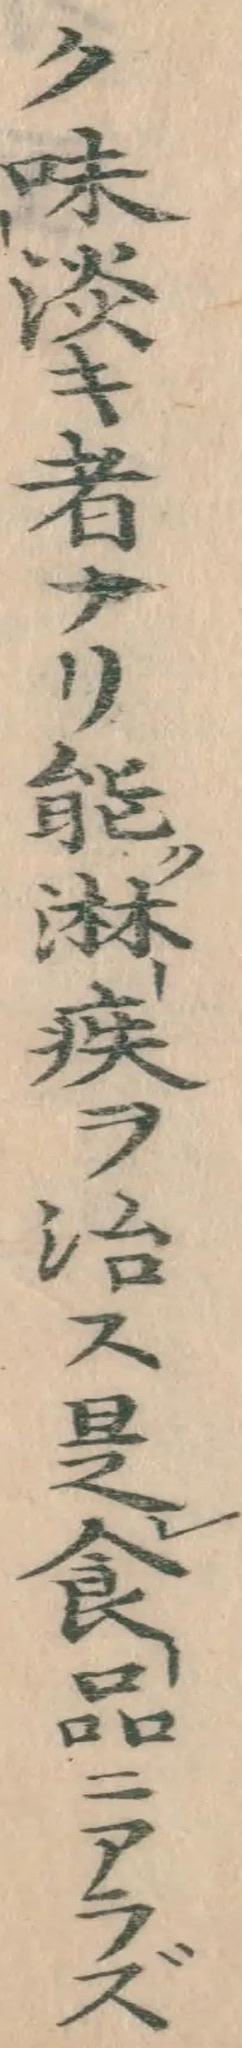ク味淡キ者ナリ能淋疾ヲ治ス是食品ニアラズ
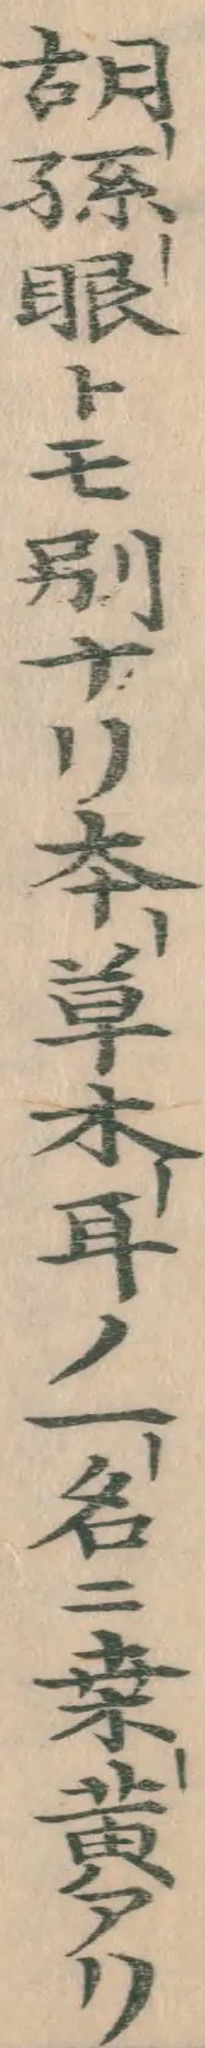胡孫眼トモ別ナリ本草木耳ノ一名ニ桑黄アリ
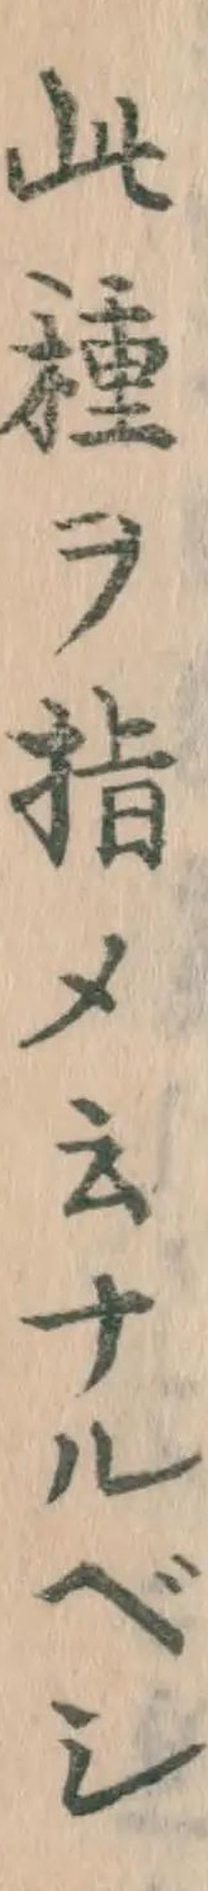此種ヲ指シテ云ナルベシ
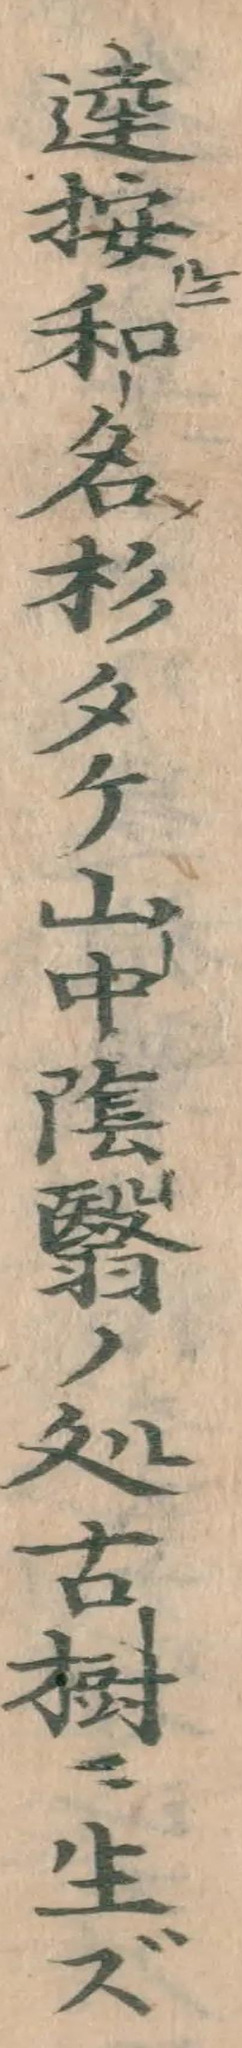達按和名杉タケ山中陰影ノ処古樹ニ生ズ
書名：怡顔斎菌品 2巻
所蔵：国立国会図書館 National Diet Library, JAPAN
